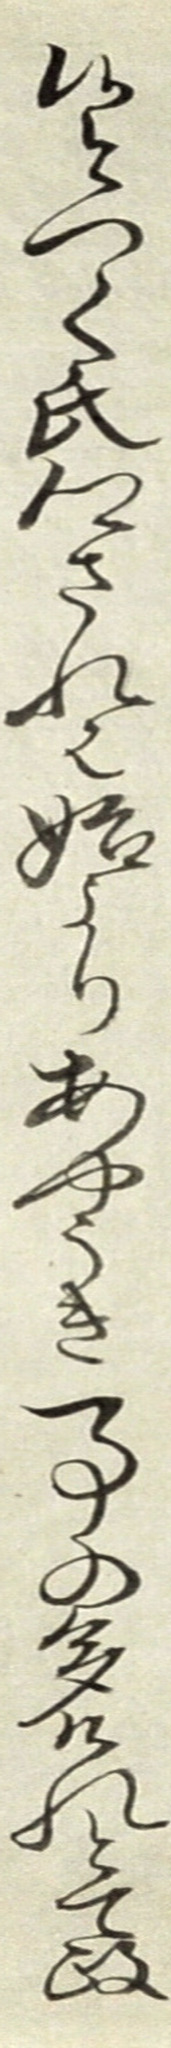候とつく氏郷されは始よりあやうき事の多けれとて政
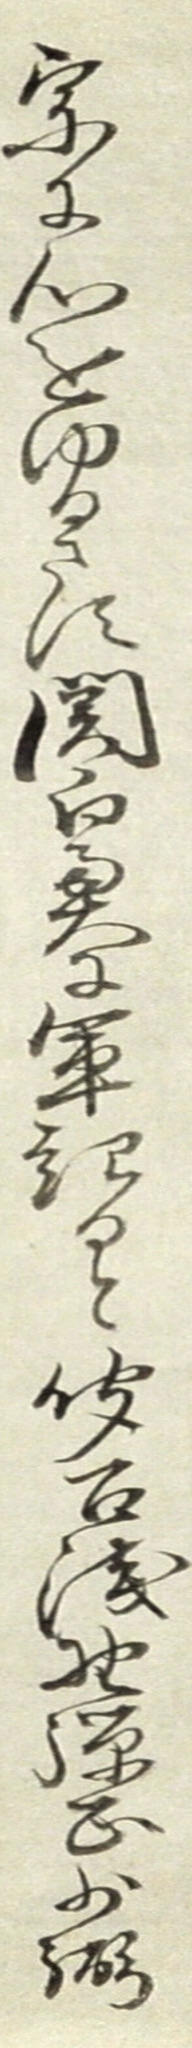宗に心をゆるさす関白奥に軍起ると聞召浅野弾正少弼
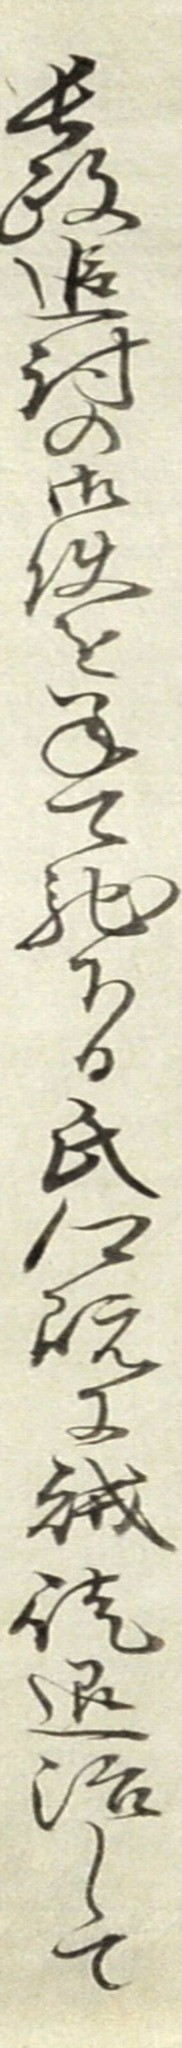長政追討の御使を承て馳下る氏郷既に賊徒退治して
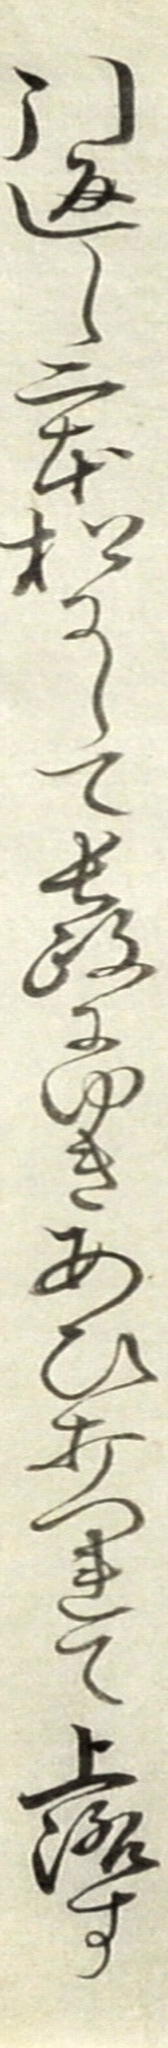引返し二本松にして長政にゆきあひ打つれて上洛す
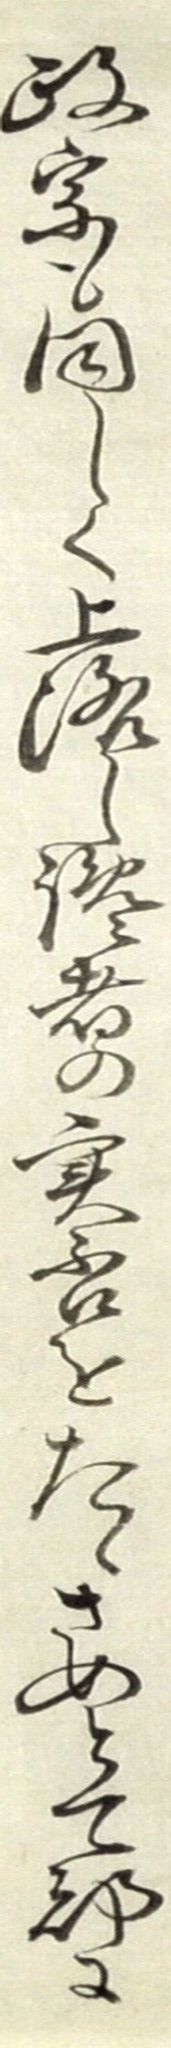政宗も同しく上洛し讒者の実否をたゝさめとて都に
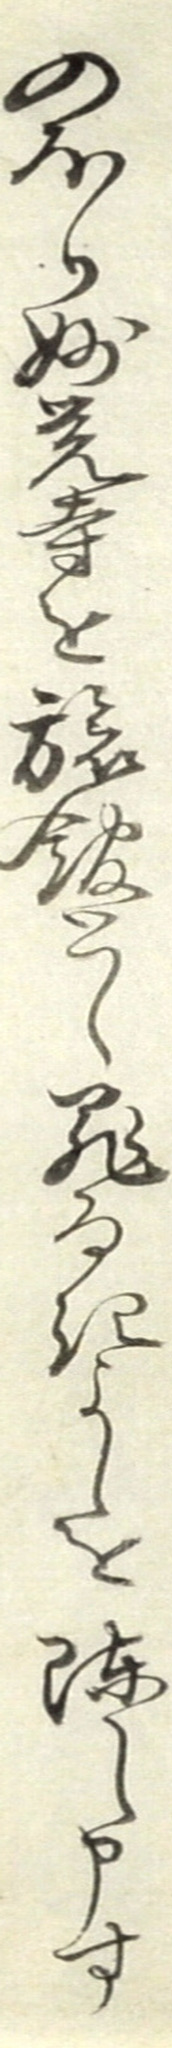のほり妙覚寺を旅館とし罪なきよしを陳し申す
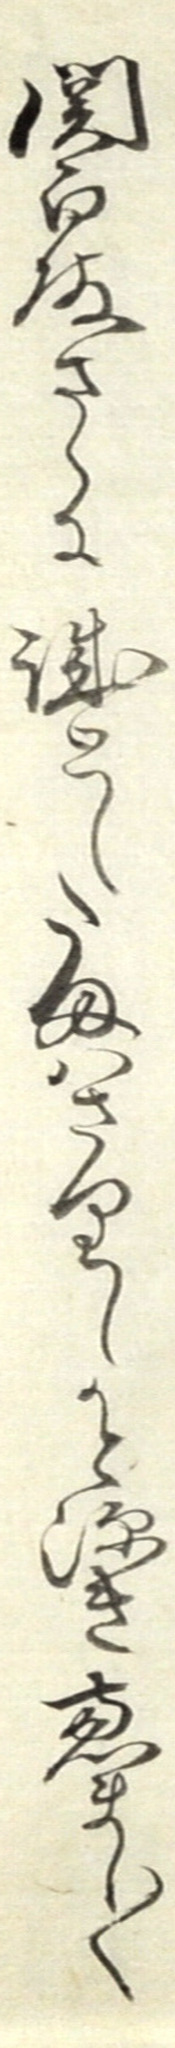関白殿さらに誠としたまはさりしかと深き慮まし〳〵
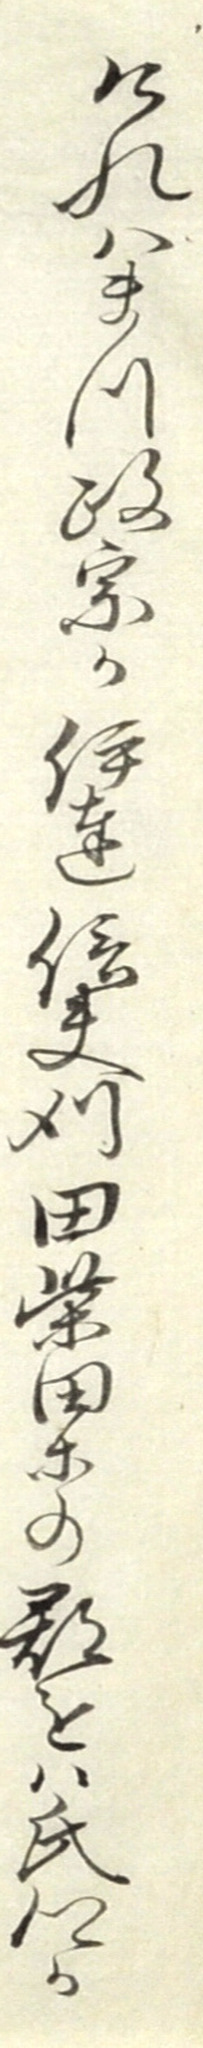けれはまつ政宗か伊達信夫刈田柴田等の郡をは氏郷か
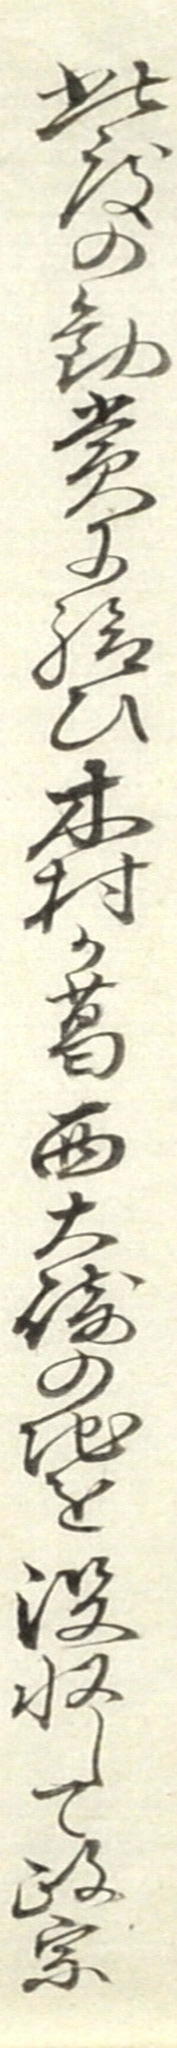此度の勧賞に給ひ木村か葛西大崎の地を没収して政宗
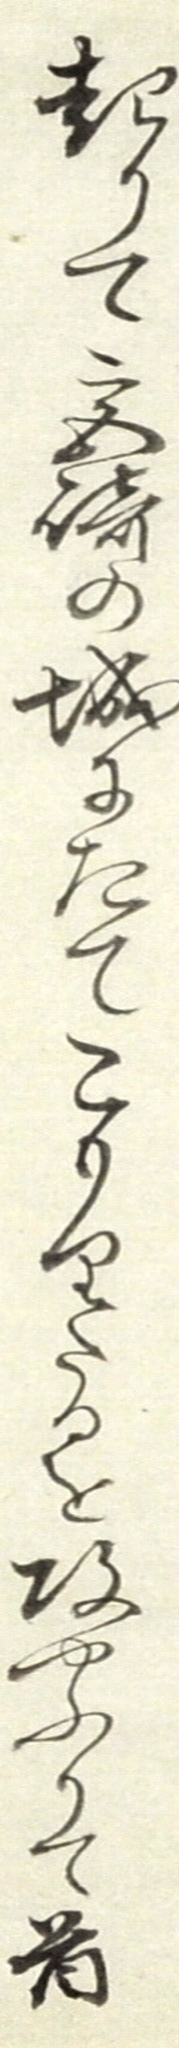起りて宮崎の城にたてこもりたるを攻やふりて首
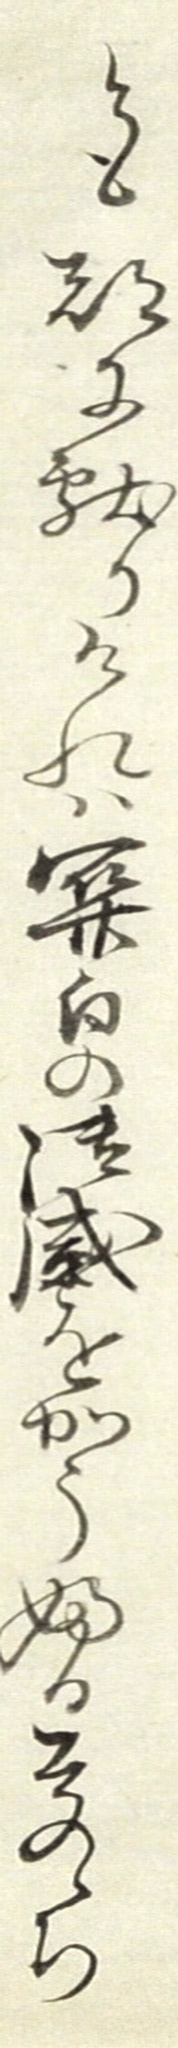とも都に献りけれは関白の御感をかうふるそのゝち
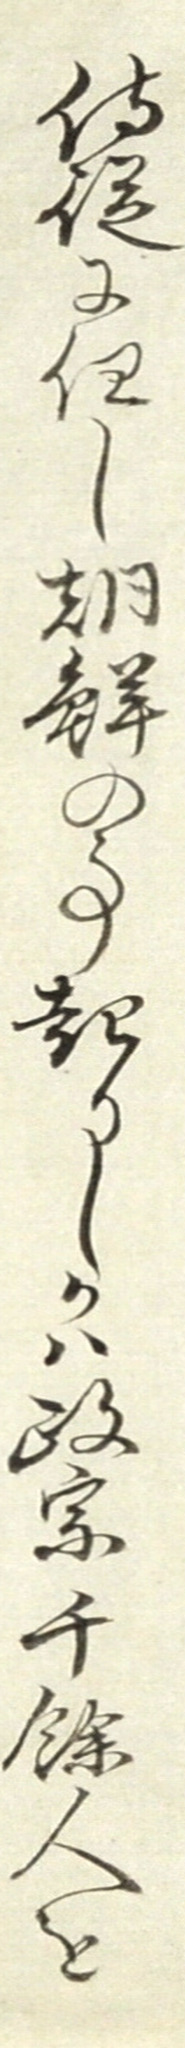侍従に任し朝鮮の事起りしかは政宗千余人を

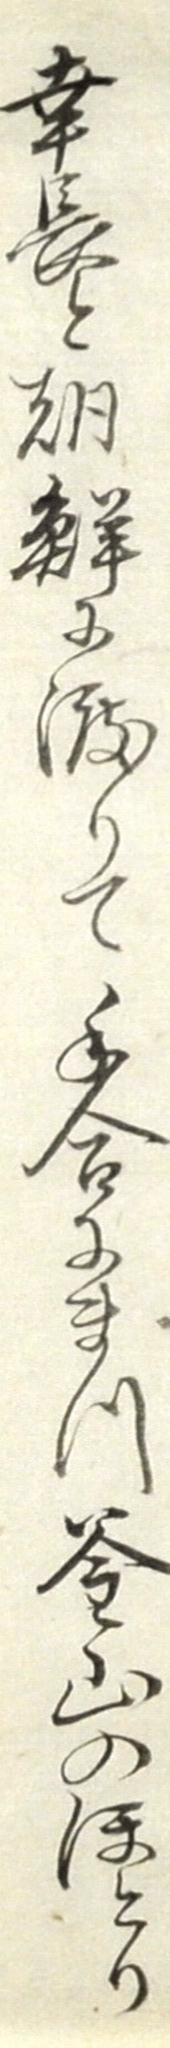幸長と朝鮮に渡りて手合にまつ釜山のほとり
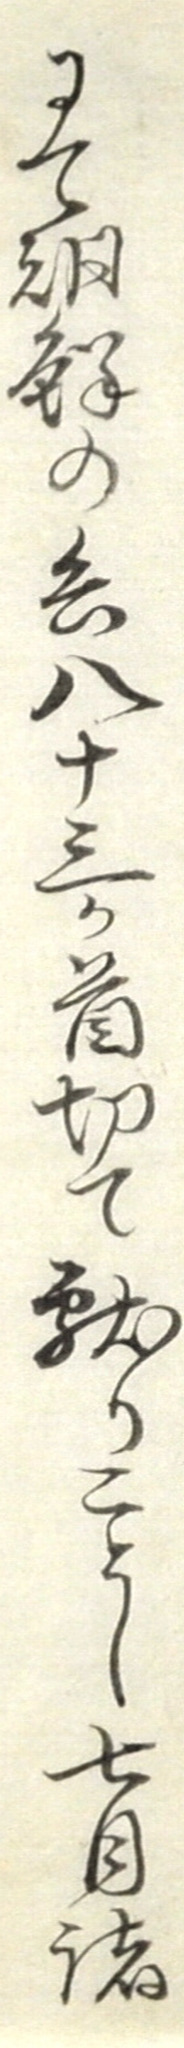にて朝鮮の兵八十三ゕ首切て献りことし七月諸
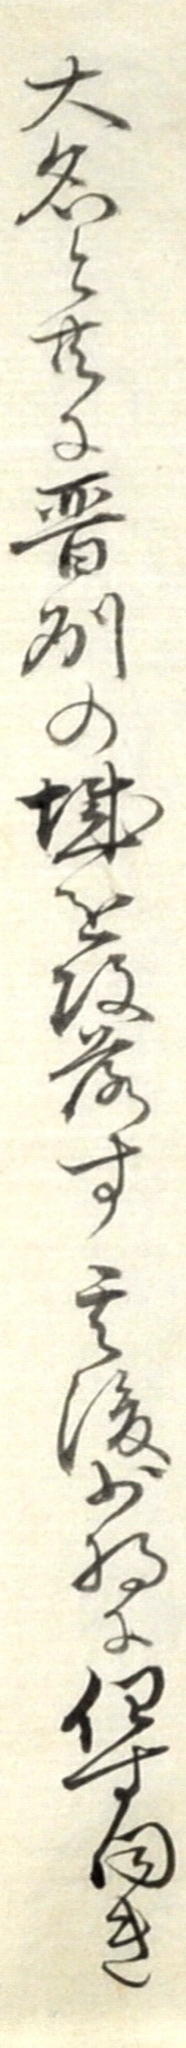大名と共に晋州の城を攻落す其後少将に任す同き
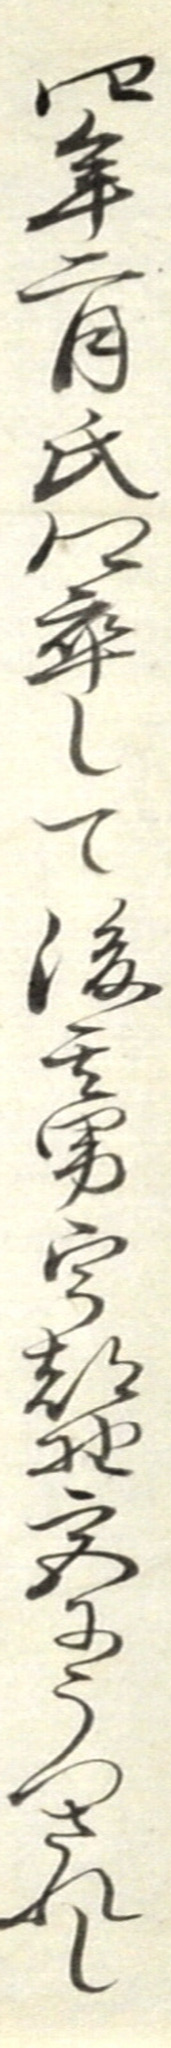四年二月氏郷卒して後其男宇都野宮にうつされし
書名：藩翰譜（七・下）
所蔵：伊那市立高遠町図書館・合同会社AMANE
